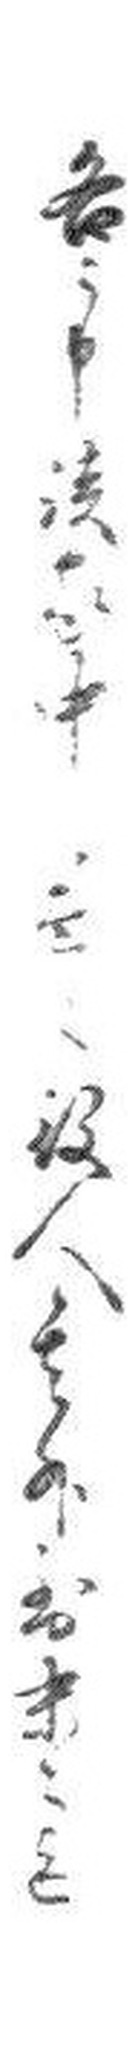各々申談家中之面々役人其外到末々迄
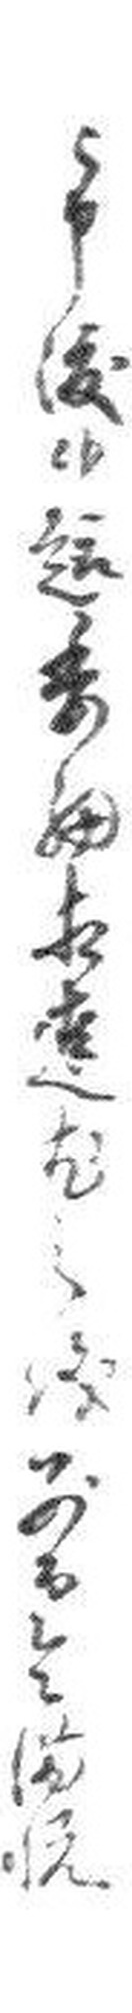被申渡候趣委細相達尤之儀別而令満悦

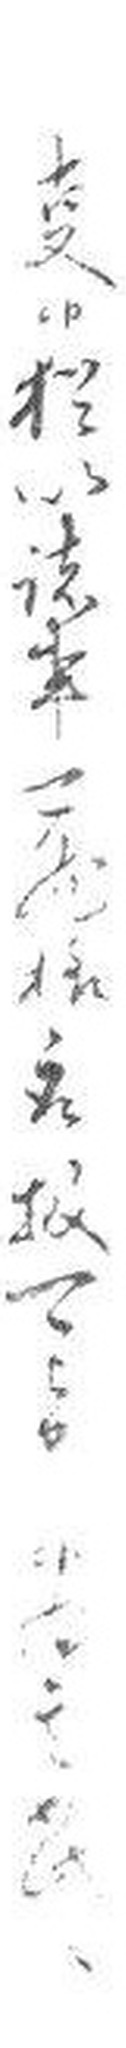事候猶以諸事可然様取扱可被申候為其如此候
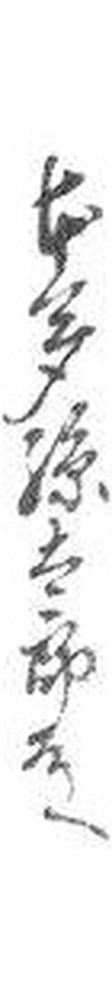本多孫太郎殿
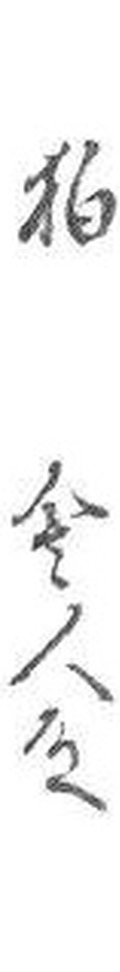狛舎人殿
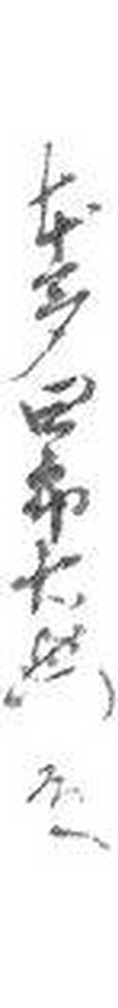本多四郎右衛門殿
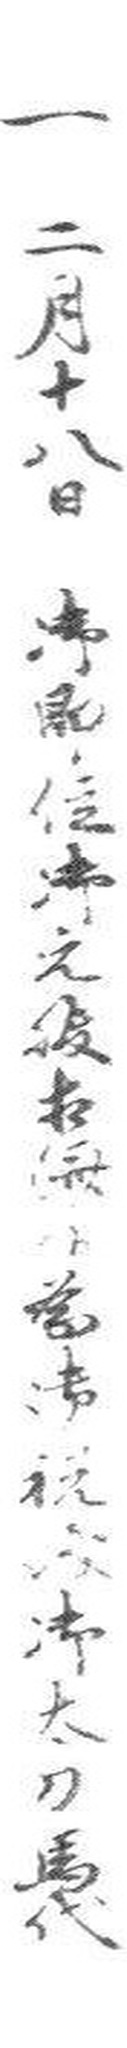一二月十八日御即位御元服相済候為御祝儀御太刀馬代
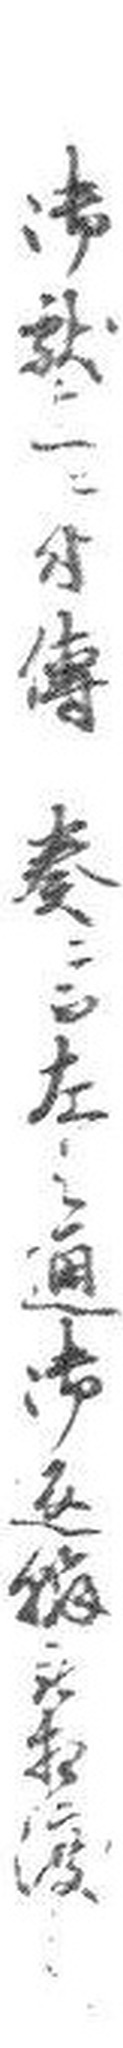御献上ニ付伝奏ニ而左之通御返翰被相渡之
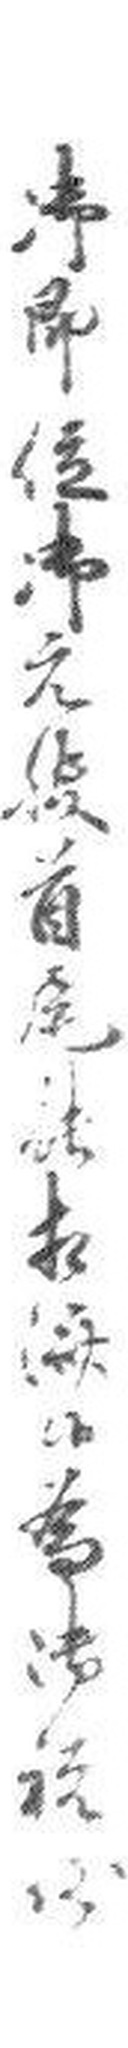御即位御元服首尾能相済候為御祝儀
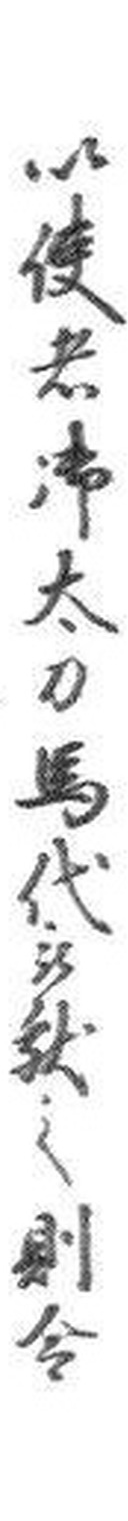以使者御太刀馬代被献之則令
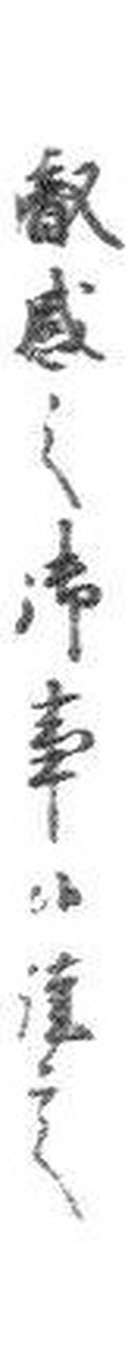叡感之御事候謹言
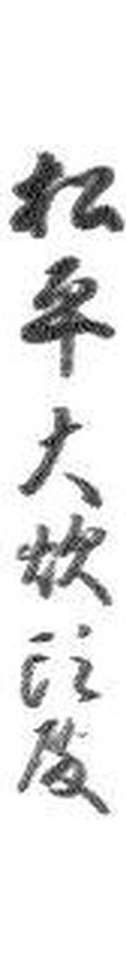松平大炊頭殿
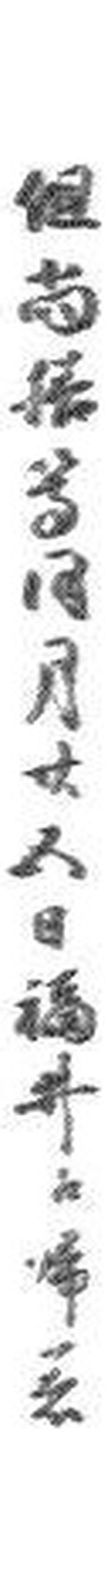但尚膳等同月廿五日福井江帰着

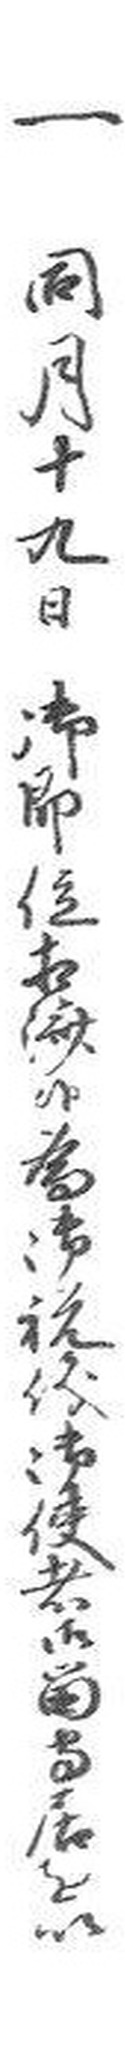一同月十九日御即位相済候為御祝儀御使者御留守居を以
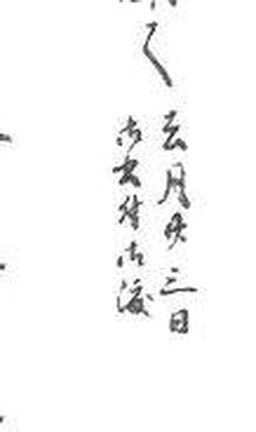御書付御渡
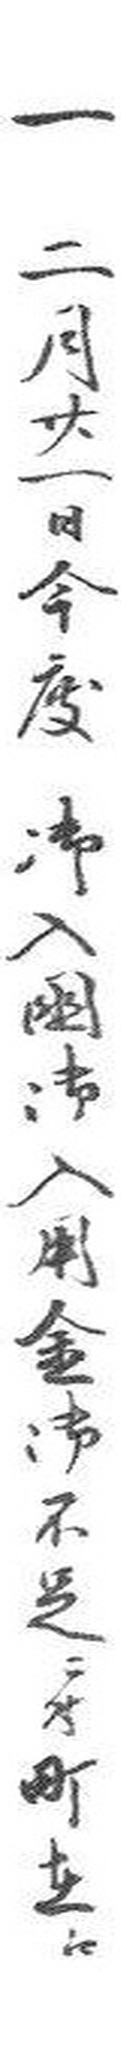一二月廿一日今度御入国御入用金御不足ニ付町在江
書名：家譜 二十八 吉邦公 従宝永七年七月五日到正徳元年十二月
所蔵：福井県文書館 Fukui Prefectural Archives
